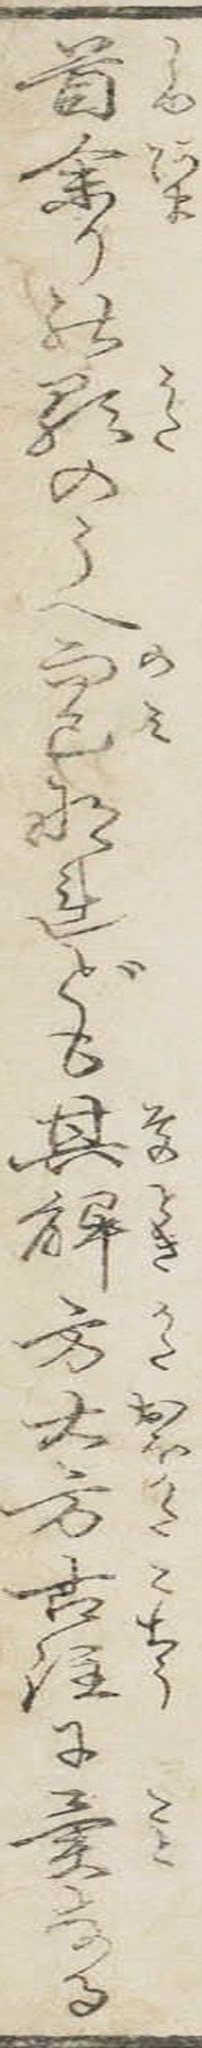首余りの歌のうへ而已なれども其解方大方古注に異なる

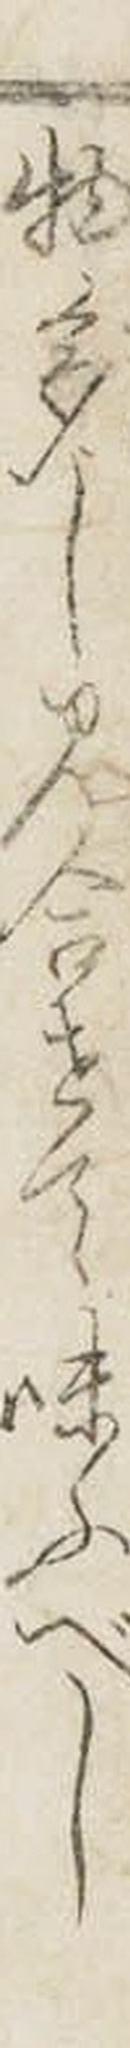物多し見合せて味ふべし
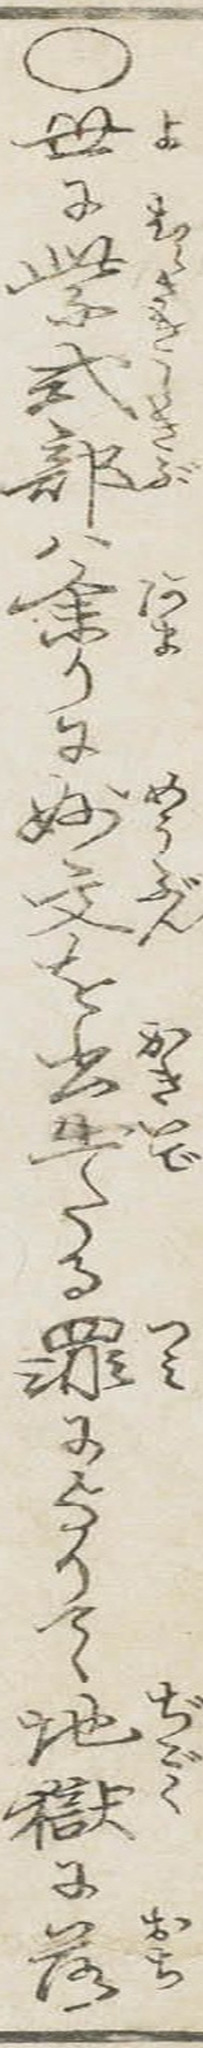○世に紫式部は余りに妙文を書出たる罪によりて地獄に落
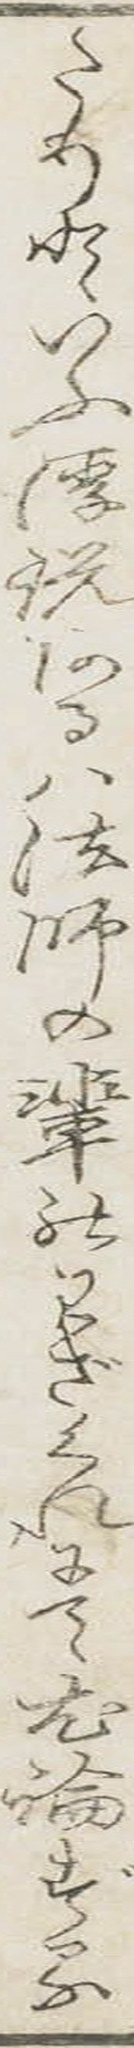たりといふ浮説あるは法師の輩のわざくれにて尤論ずる
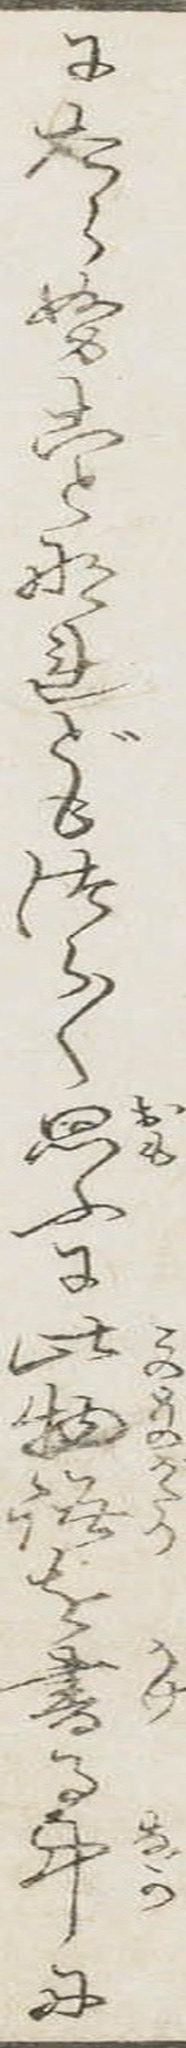にたらぬことなれどもつら〳〵思ふに此物語を書る中に
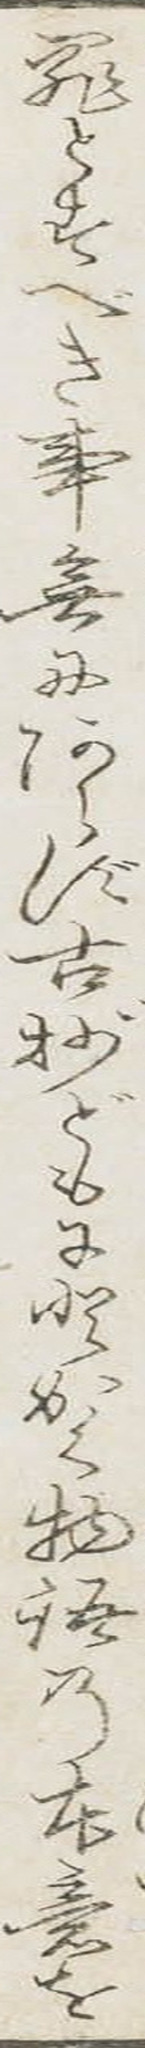罪とすべき事無にあらず古抄どもにとかく物語の本意を
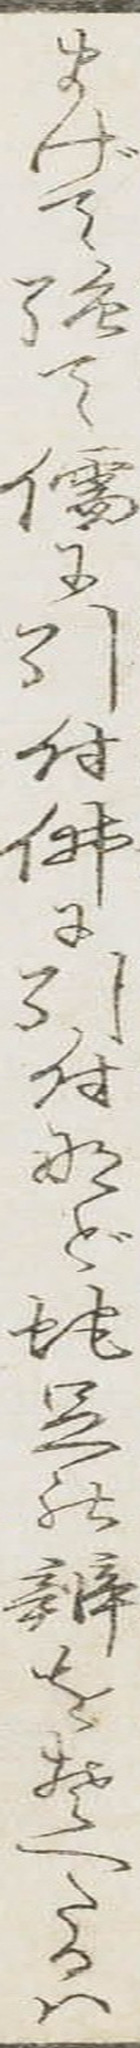まげて強て儒に引付仏に引付など蛇足の弁をそへたるは
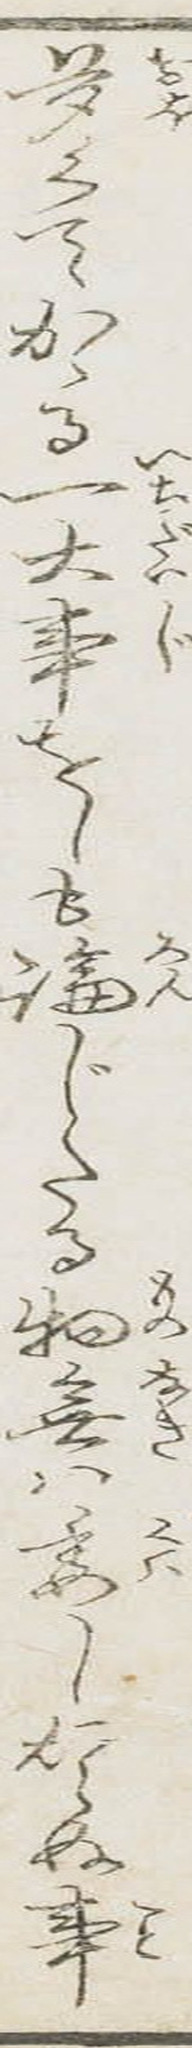多くてかゝる一大事をしも論じたる物無は委しからぬ事
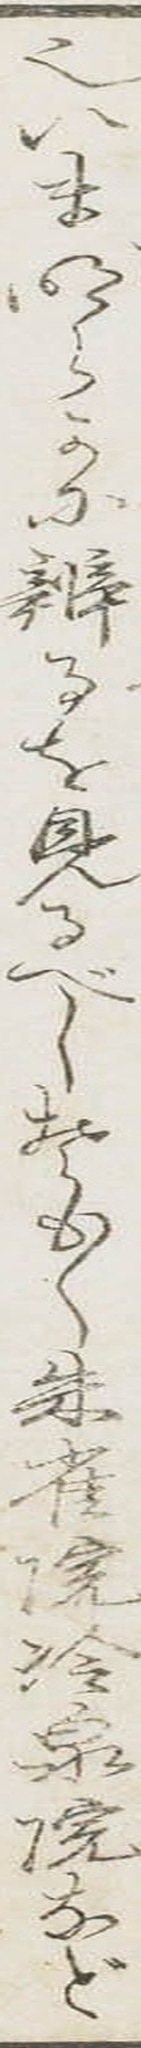也いま明らかに弁るを見るべしそも〳〵朱雀院冷泉院など
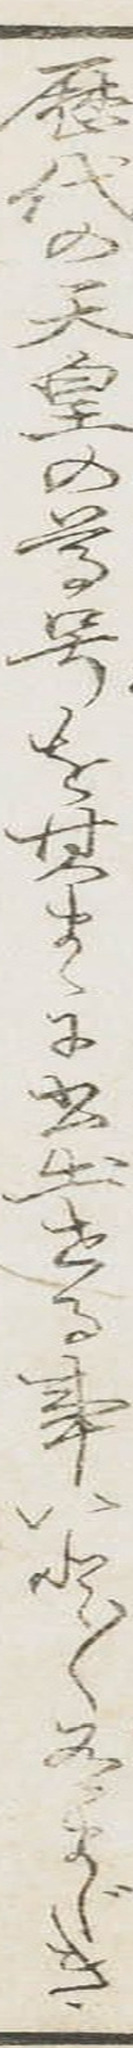歴代の天皇の尊号を其まゝに書出せる事いと〳〵ゆ有まじき
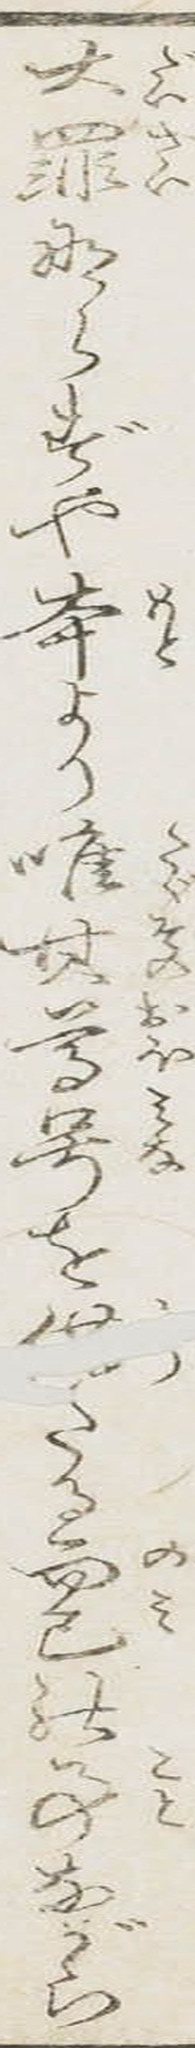大罪ならずや本より唯其尊号を借たる而已の事ながら
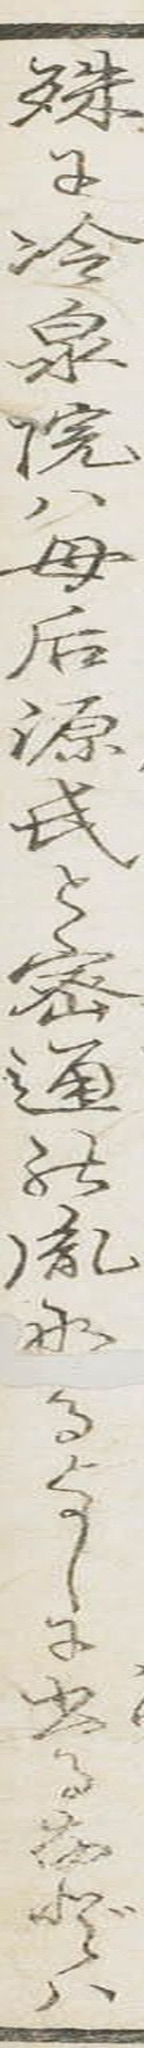殊に冷泉院は母后源氏と密通の胤なるよしに書るなどは
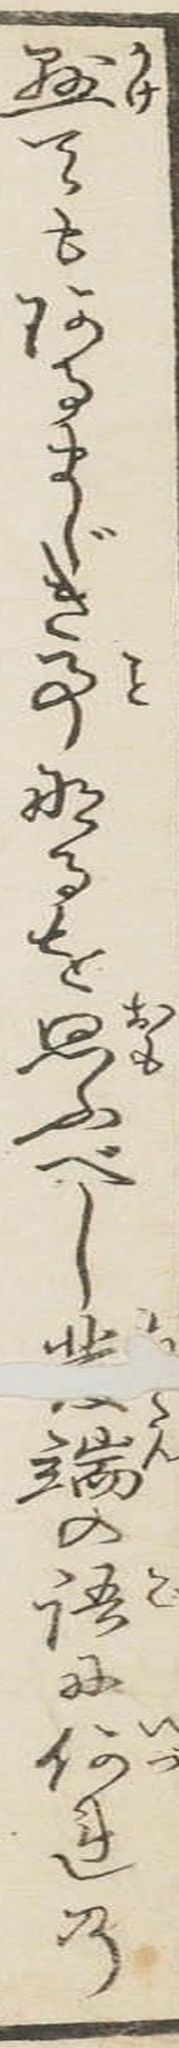懸てもあるまじき事なるを思ふべし発端の語に何れの
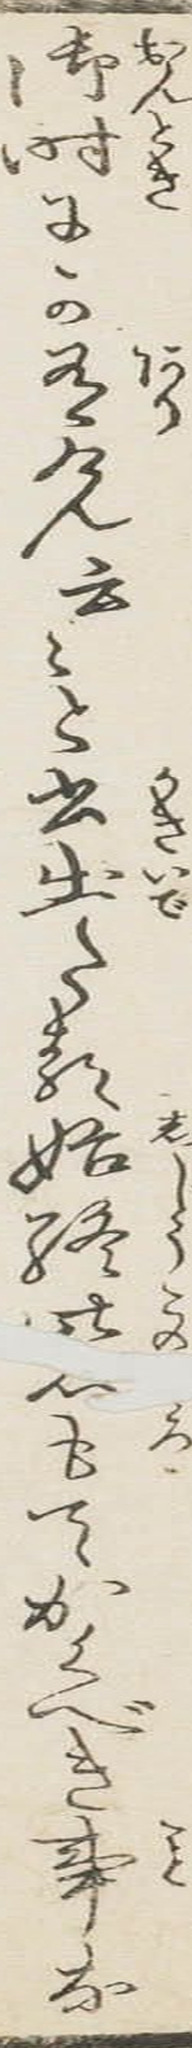御時にか有けん云々と書出たる始終此心もてかくべき事な
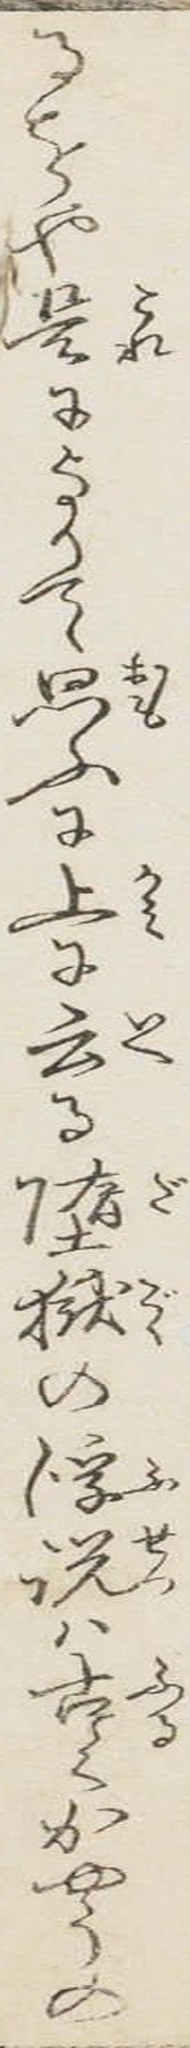るをや是によりて思ふに上に云る堕獄の浮説は古くかやうの
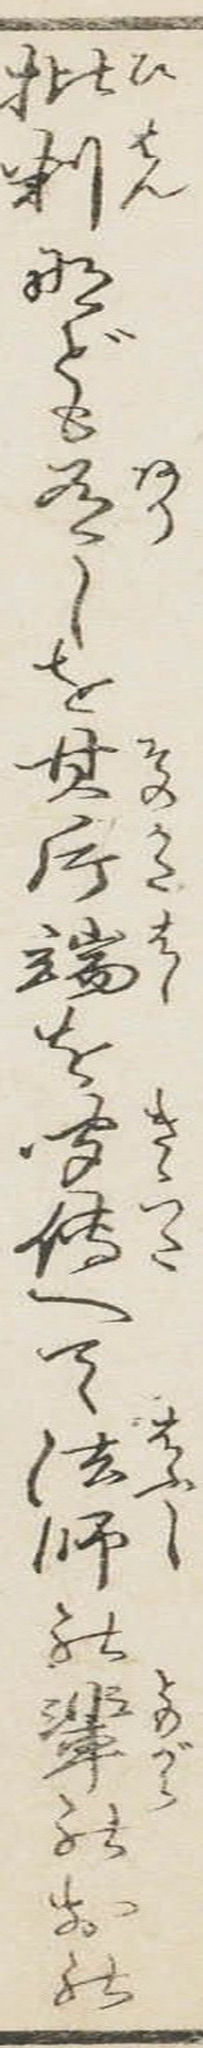批判なども有しを其片端を聞伝へて法師の輩のおの
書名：源氏百人一首
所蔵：東京学芸大学教育コンテンツアーカイブ
